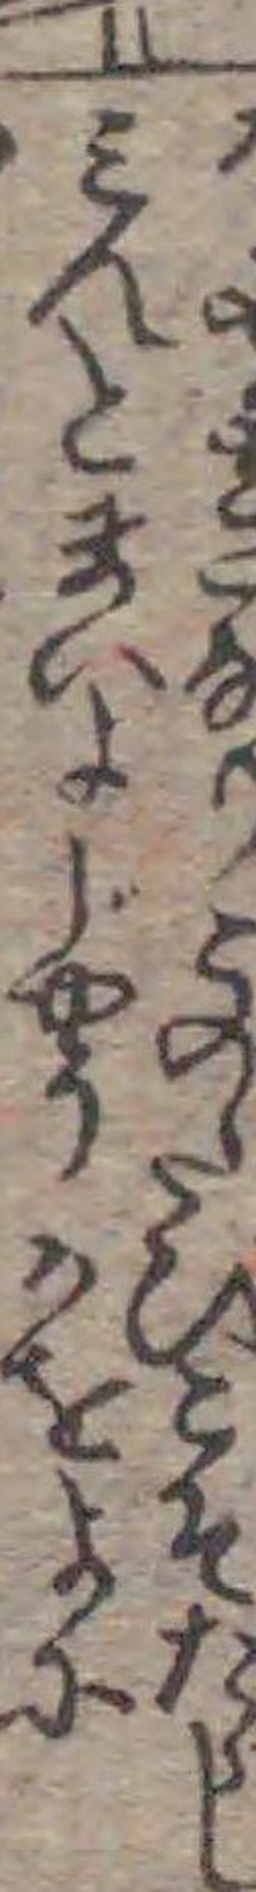みんとまいよじやうかをよに
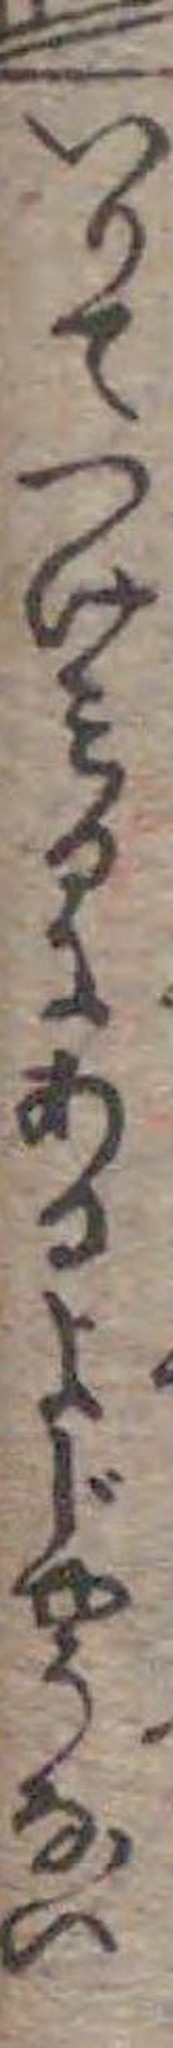いりてつけみるにあるよじやうない
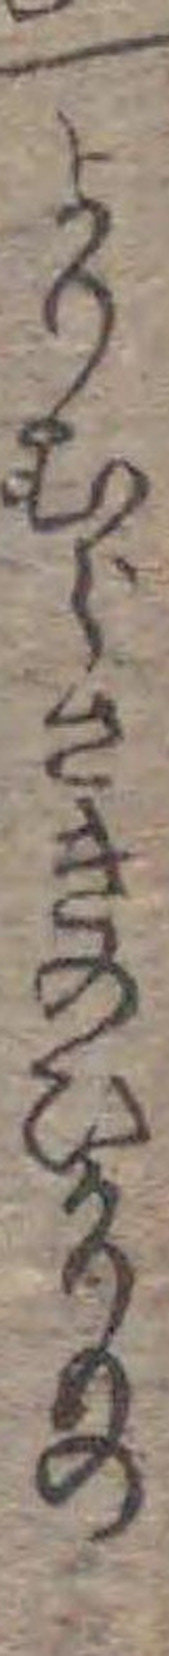よりむらさきのひかりもの
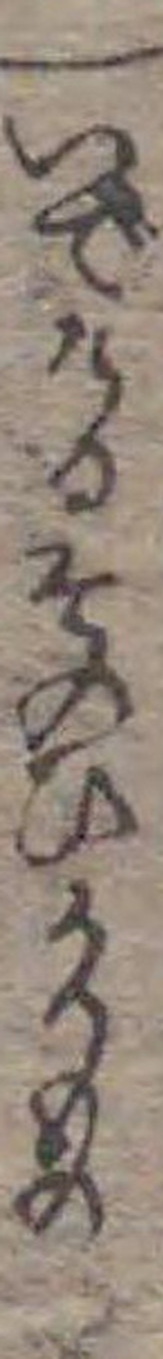いでけるそのひかりもの
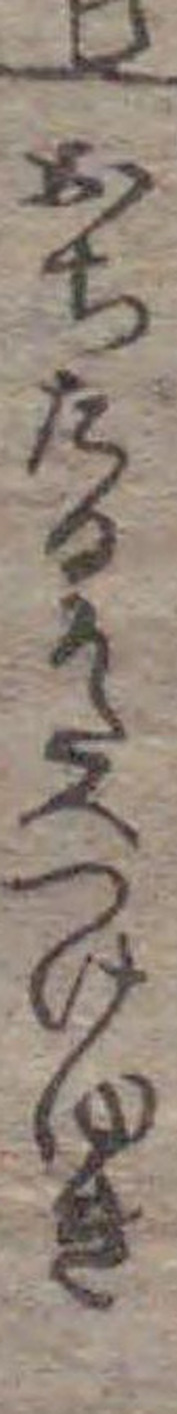おちたるかたへつけゆき
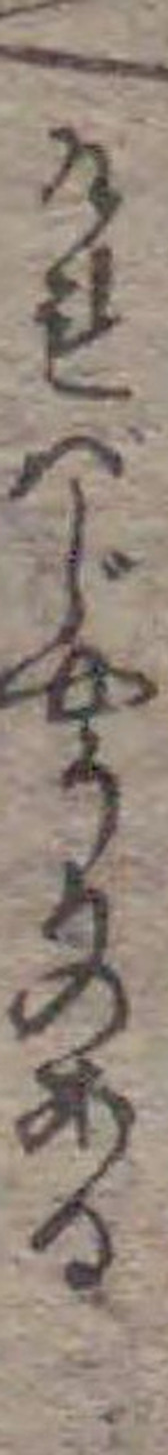ければじやうかのある

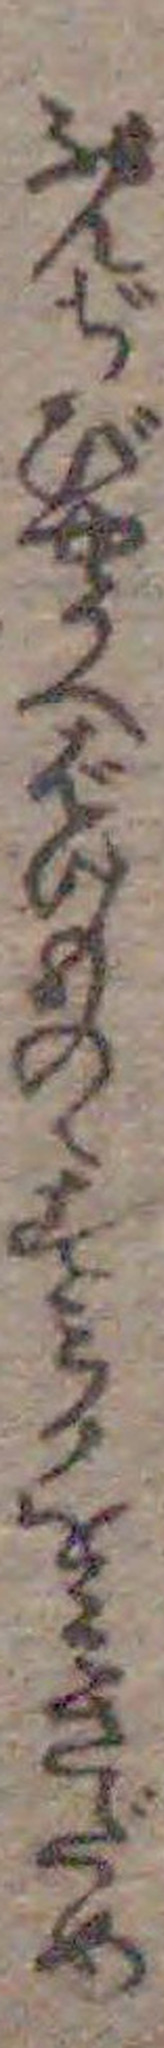ぶんぢびやうへばけものゝすみかをみさだめ
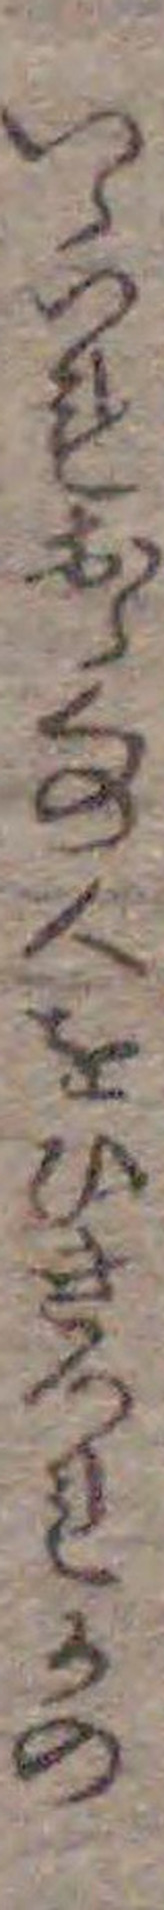いゝつれおゝくの人をひきつれかの
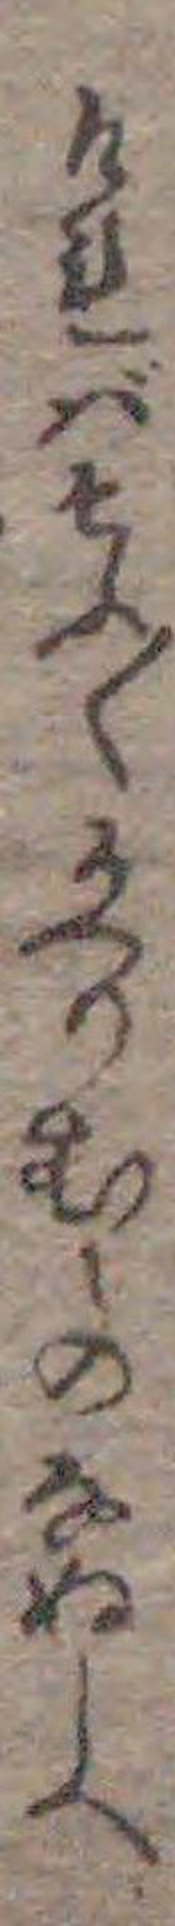ければそふ〳〵かへりむらのなぬしへ
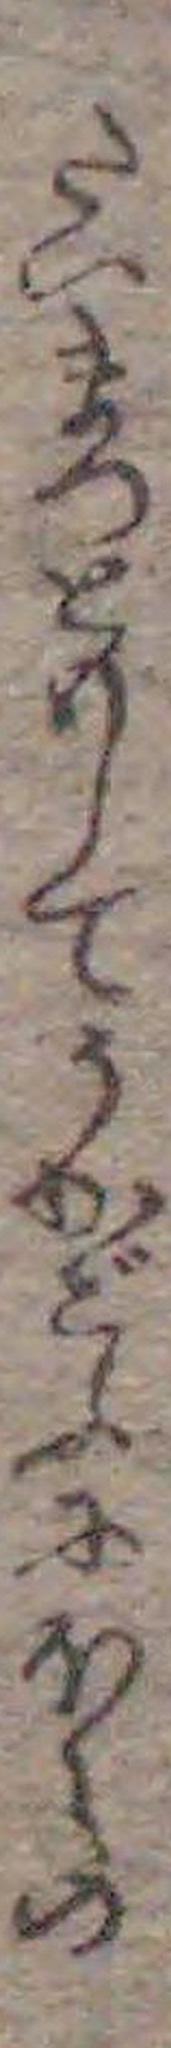たいまつともしてうかごふにほの
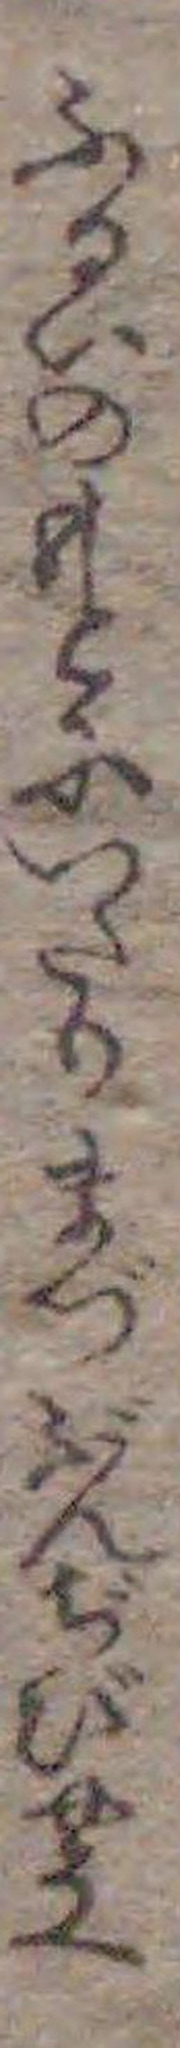ふるいのもとにいたりまづぶんぢびやうへ
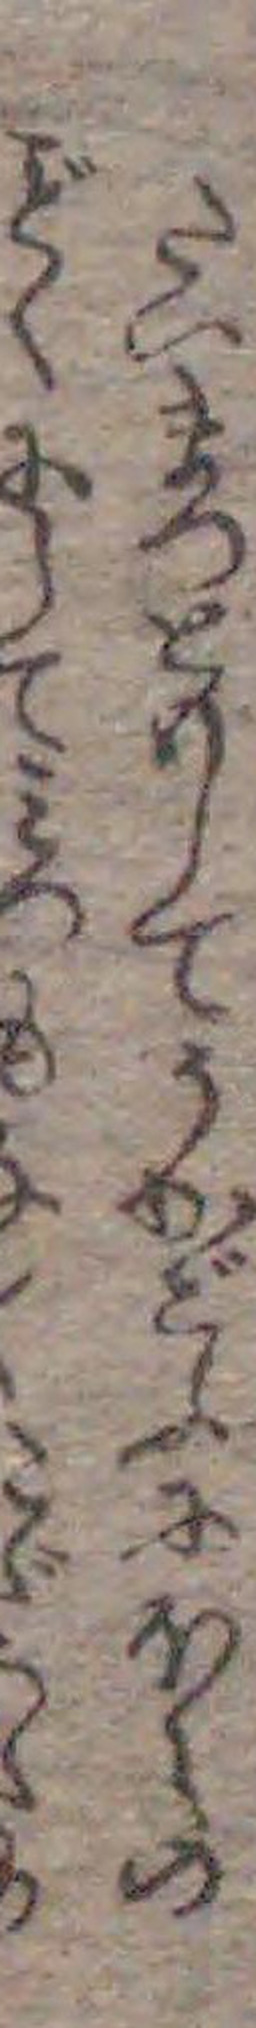ごとくにしてみつもなくたゞあたか
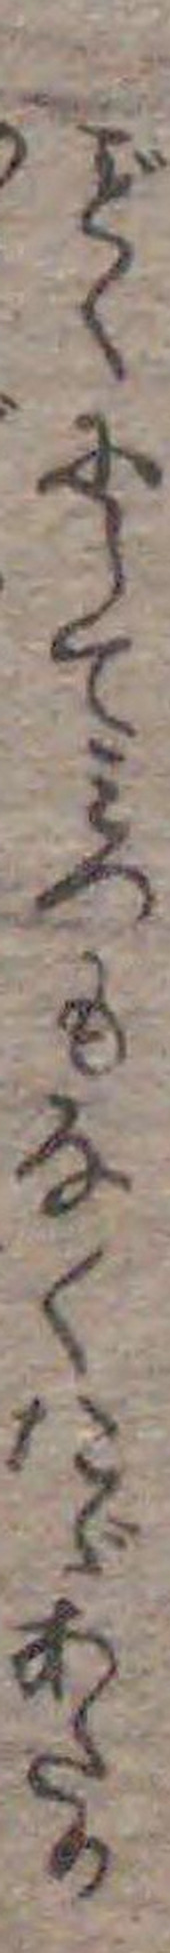ごとくにしてみつもなくたゞあたか
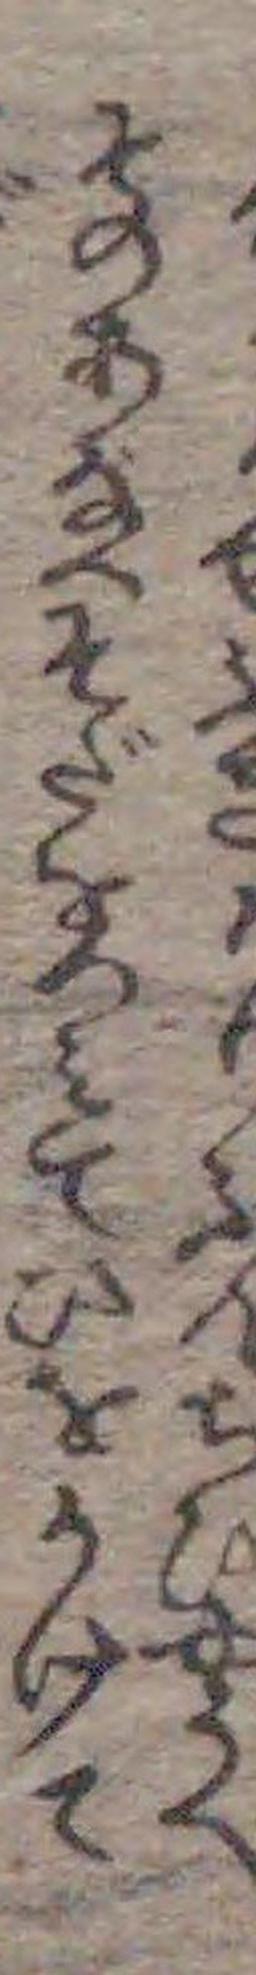そのあなへそだをつみてひをかけて
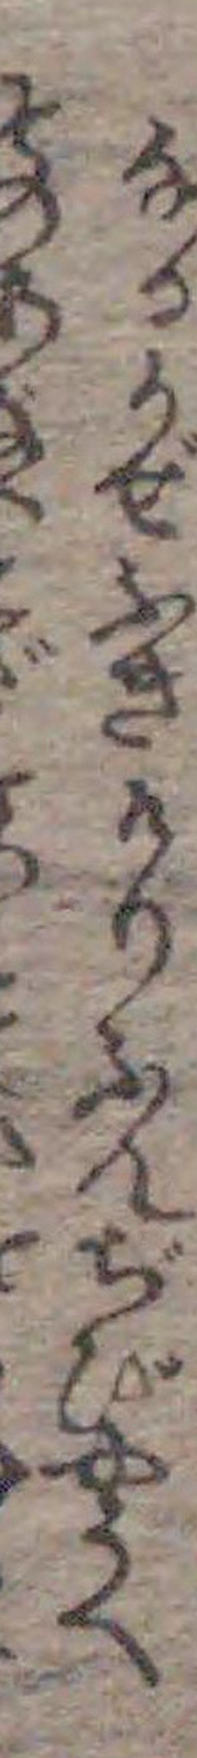なるかぜふきけりふんぢびやうへ
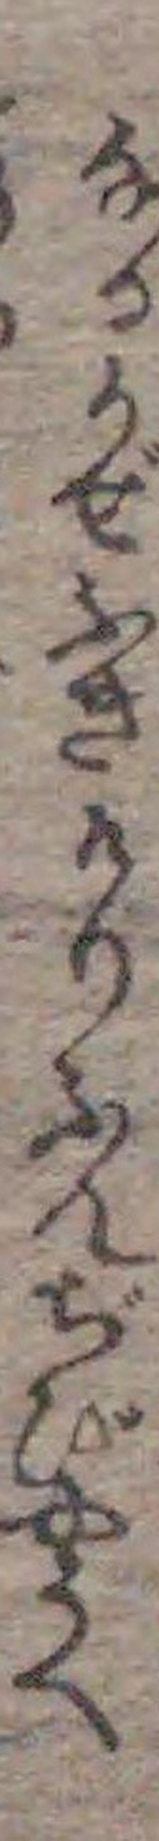なるかぜふきけりふんぢびやうへ
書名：変化物春遊 : 2巻
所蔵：国立国会図書館 National Diet Library, JAPAN
